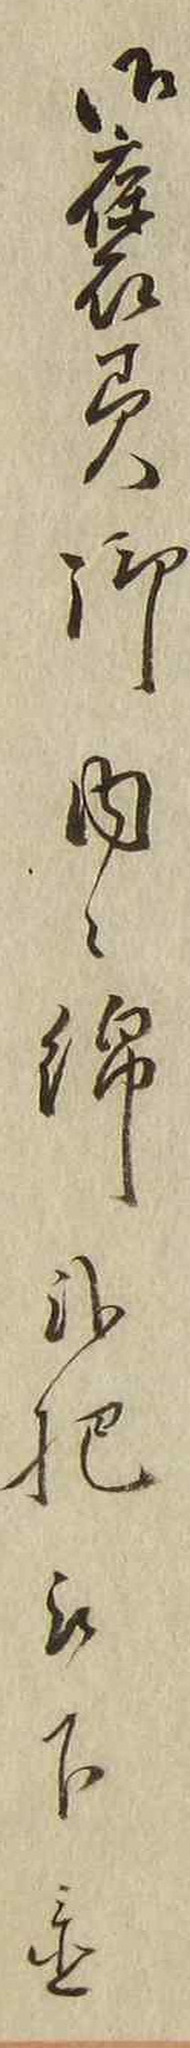御褒美御内々綿弐把被下置

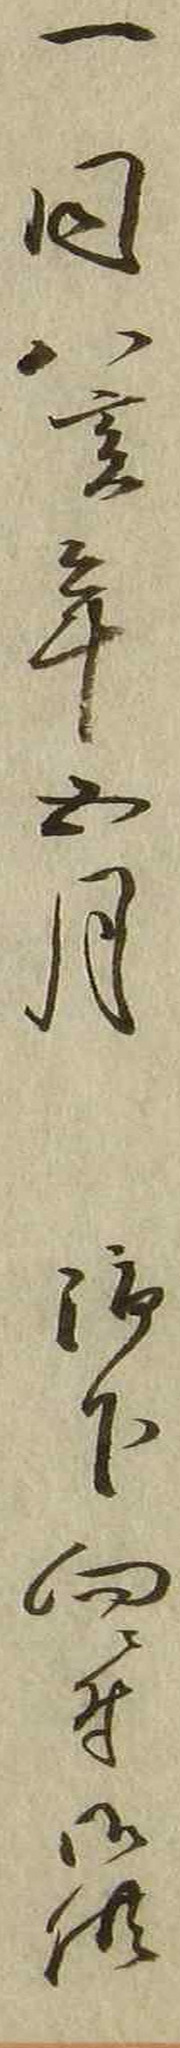一同八亥年五月御下向ニ付御供
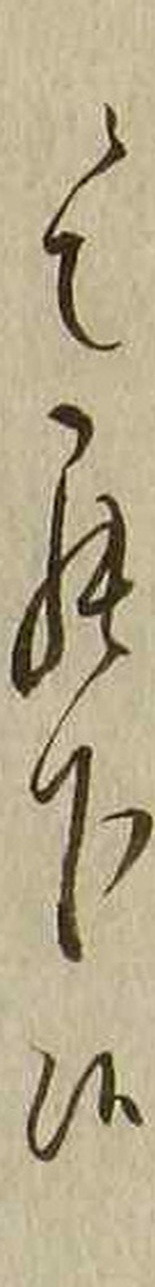ニて罷下候
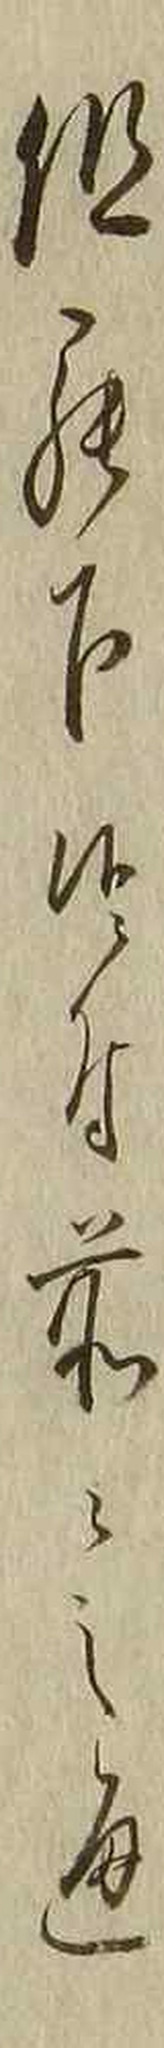但罷下候ニ付前々之通
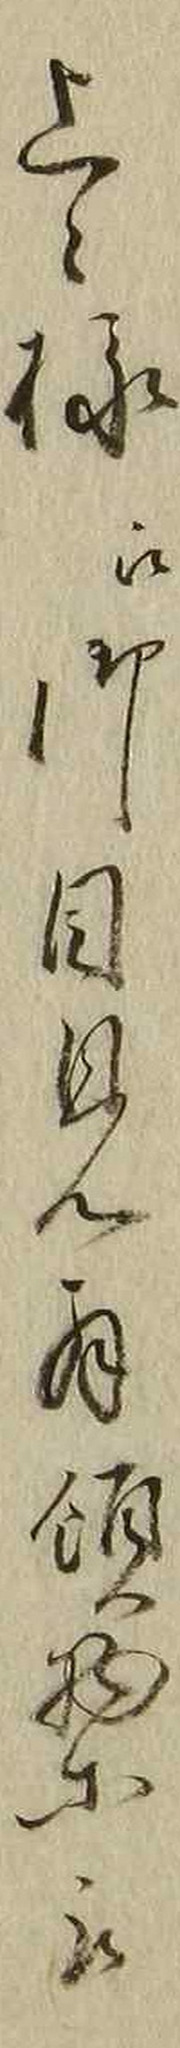上々様江御目見拝領物等被
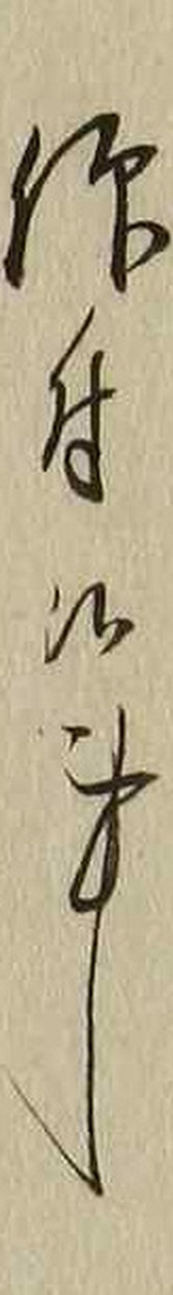仰付候事
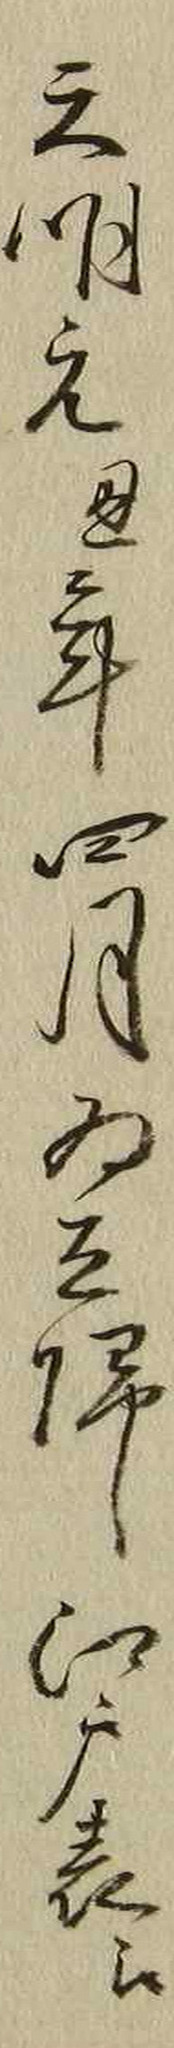元明元丑年四月為立帰江戸表江
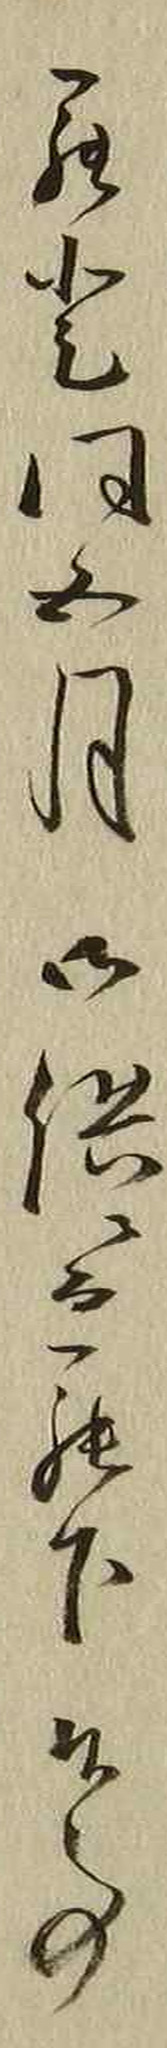罷登同五月御供ニ而罷下候事
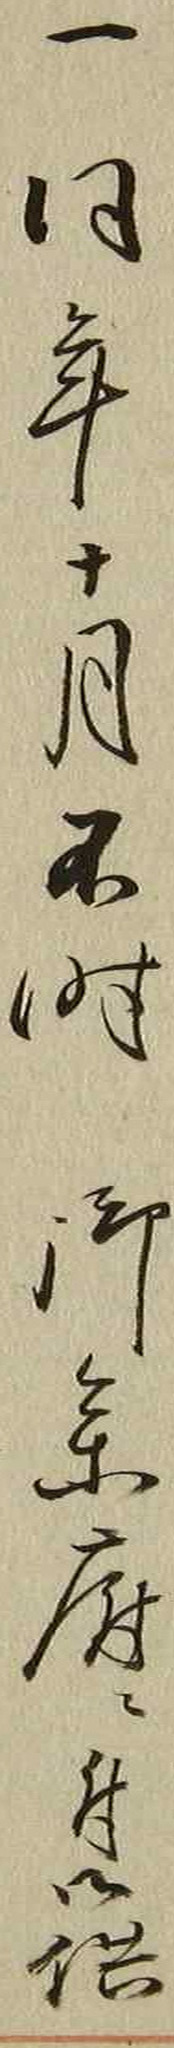一同年十月不時御参府ニ付御供
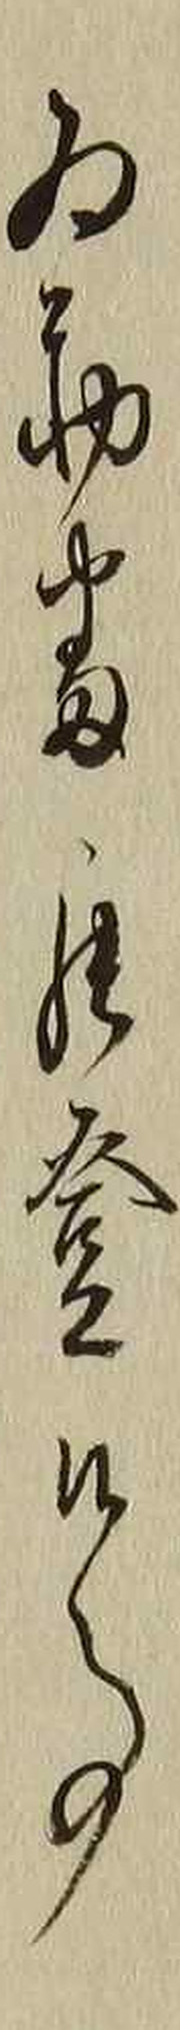為勤番罷登候事
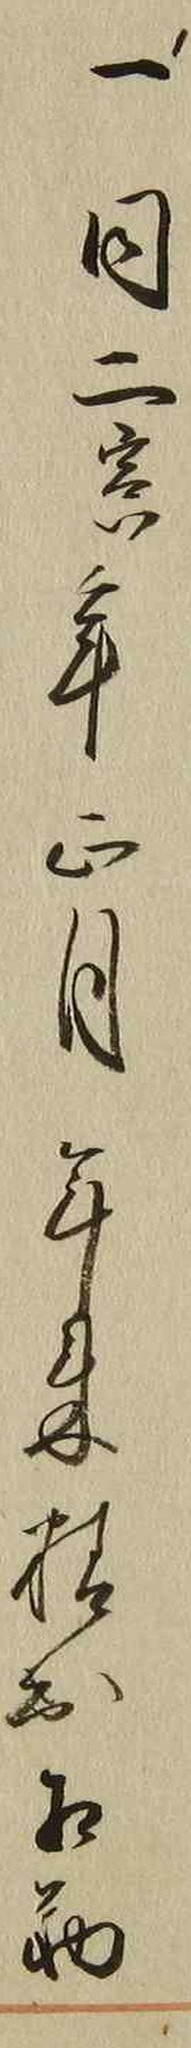一同二寅年正月年来精出相勤
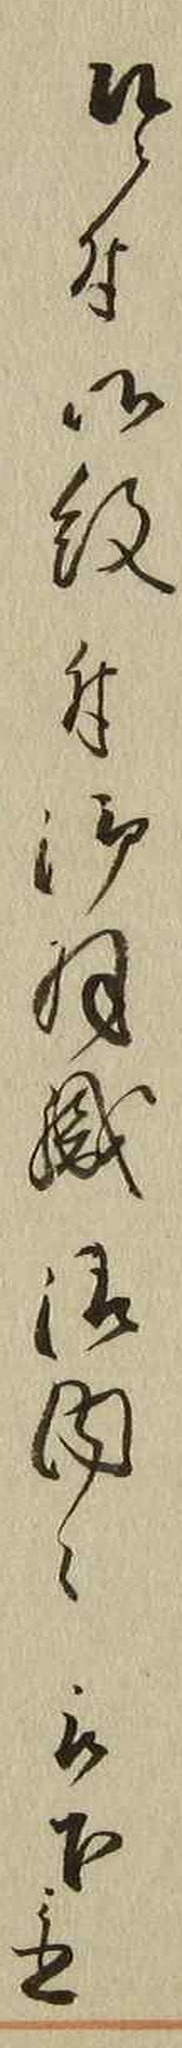候ニ付御紋付御羽織御内々被下置
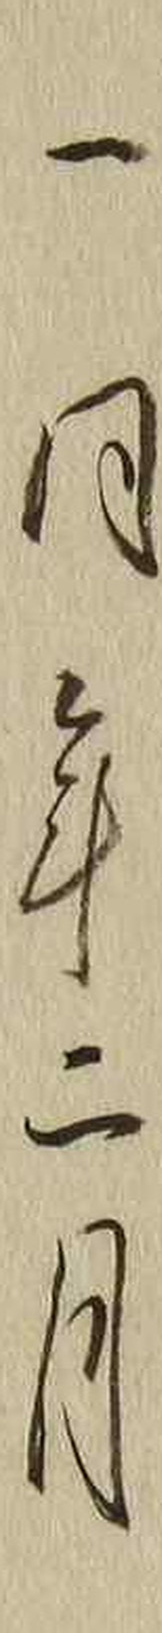一同年二月
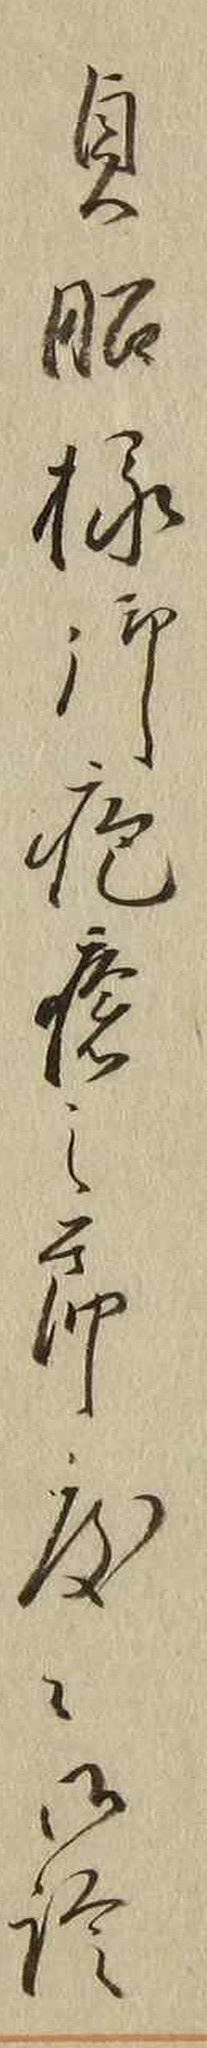貞昭様御疱瘡之節度々御診
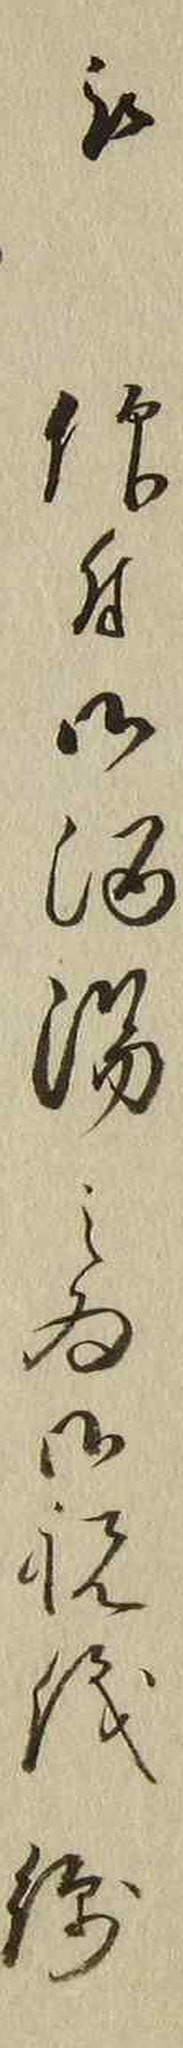被仰付御酒湯之為御祝儀綿
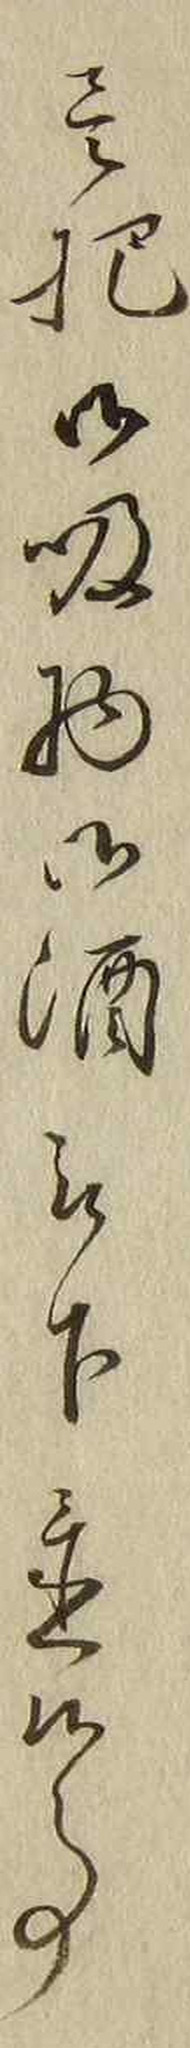壱把御吸物御酒被下置候事
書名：諸士系譜　巻之68　を之部2
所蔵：会津若松市立会津図書館
